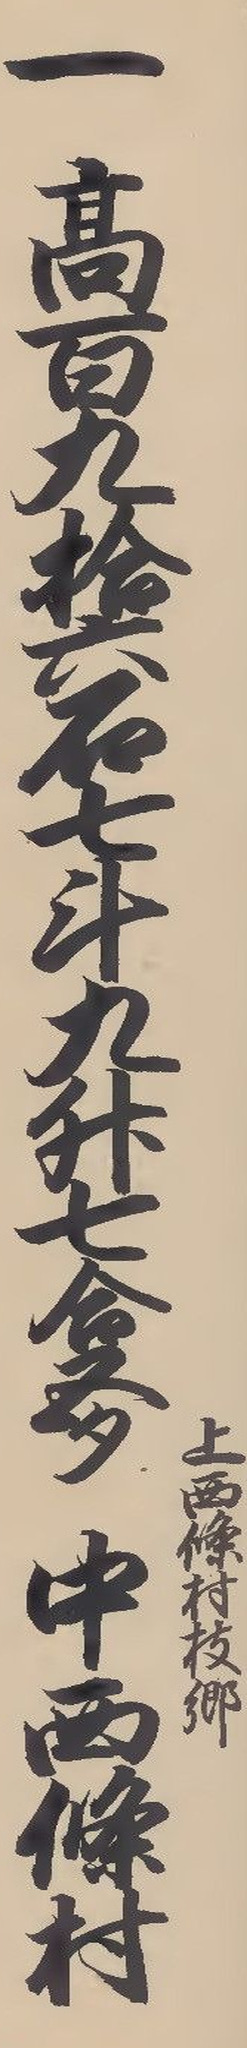一高百九拾六石七斗九升七合五勺中西条村
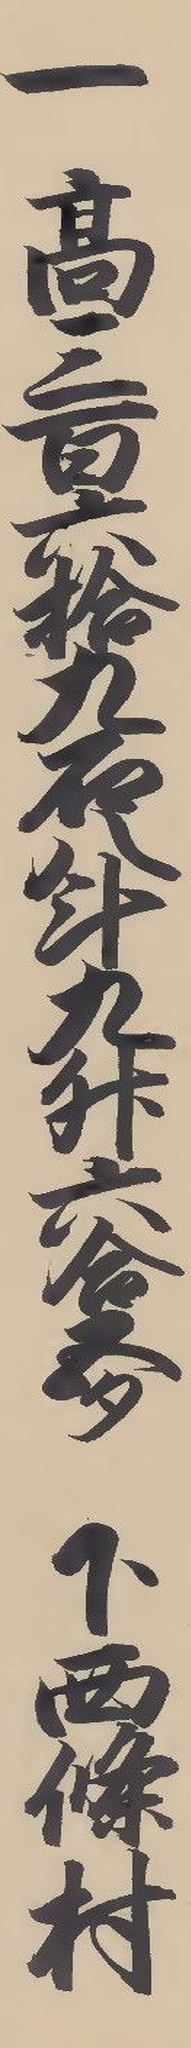一高三百六拾九石八斗九升六合五勺下西条村
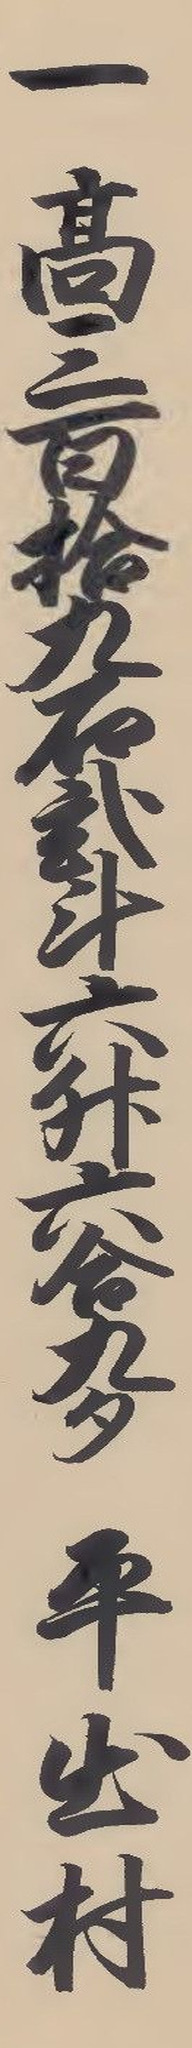一高三百拾九石弐斗六升六合九勺平出村
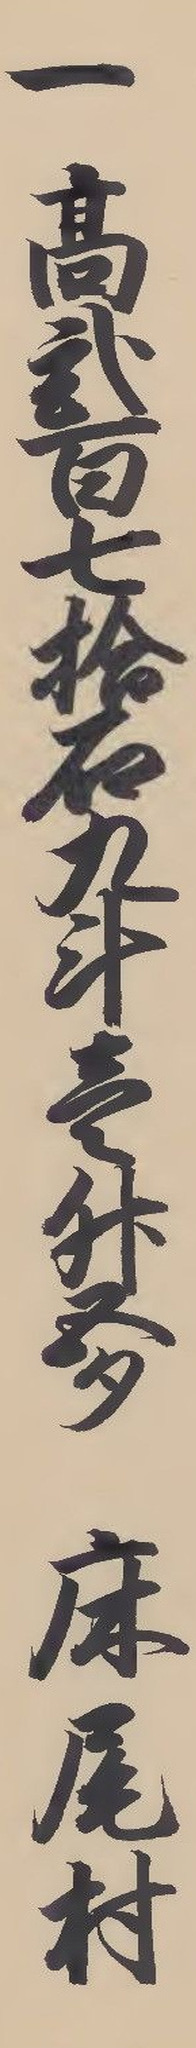一高弐百七拾石九斗壱升五勺床尾村

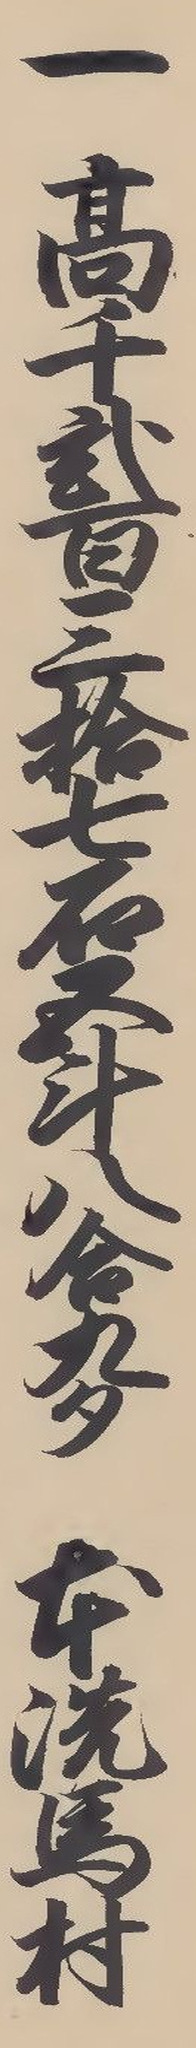一高千弐百三拾七石五斗八合九勺本洗馬村
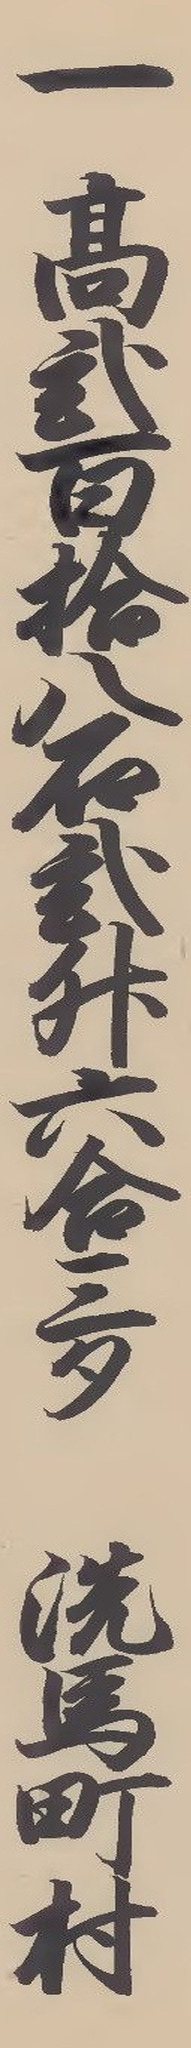一高弐百拾八石弐升六合三勺洗馬町村
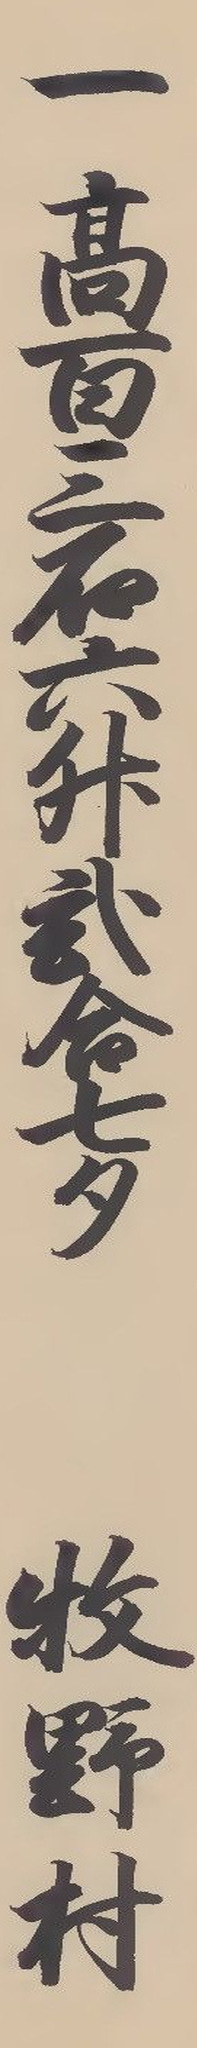一高百三石六升弐合七勺枚野村
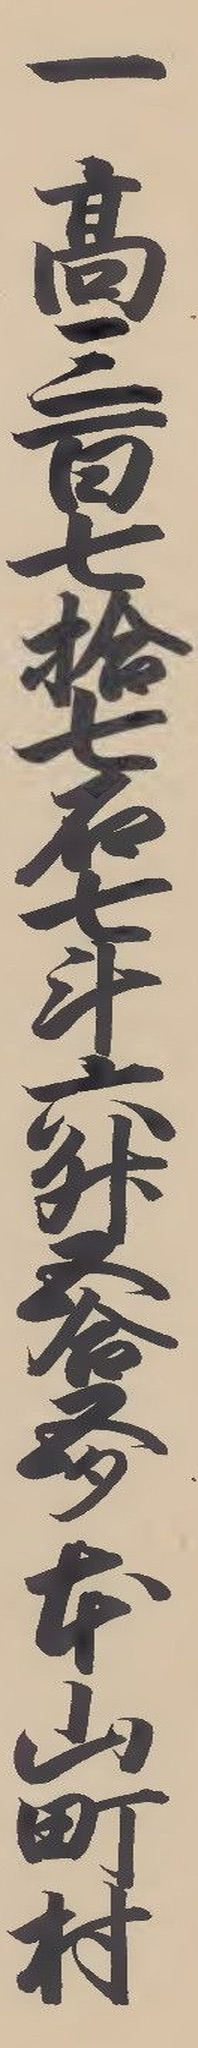一高三百七拾七石七斗六升五合五勺本山町村
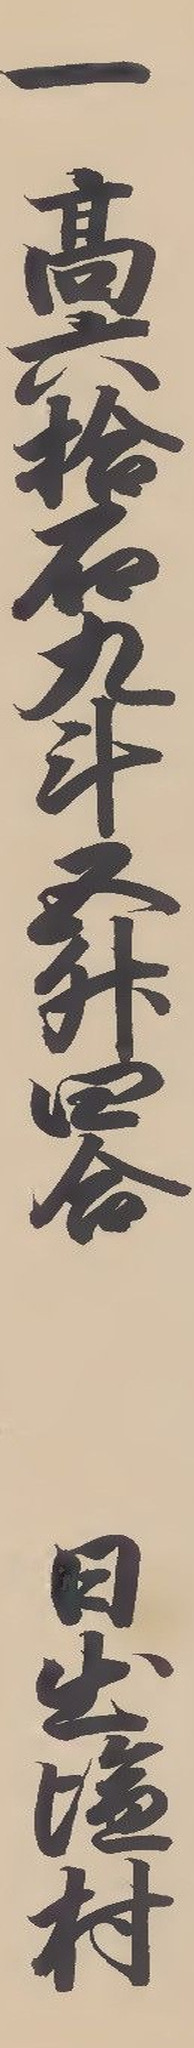一高六拾石九斗五升四合日出塩村

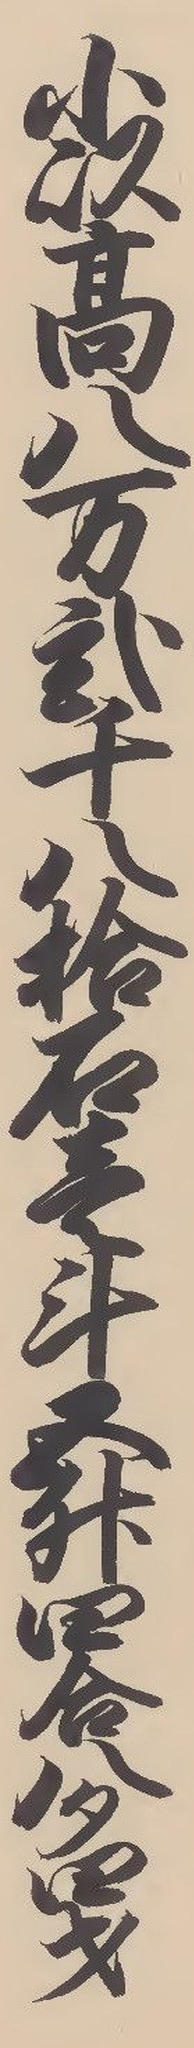小以高八万弐千八拾石壱斗五升四合八勺四才
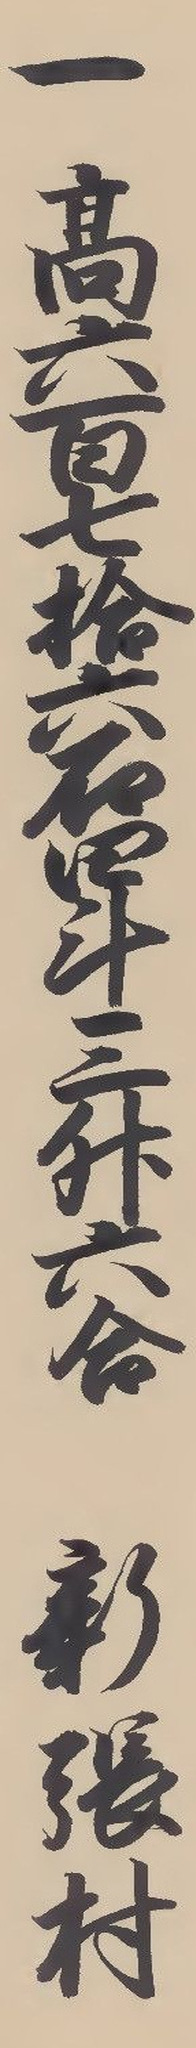一高六百七拾六石四斗三升六合新張村
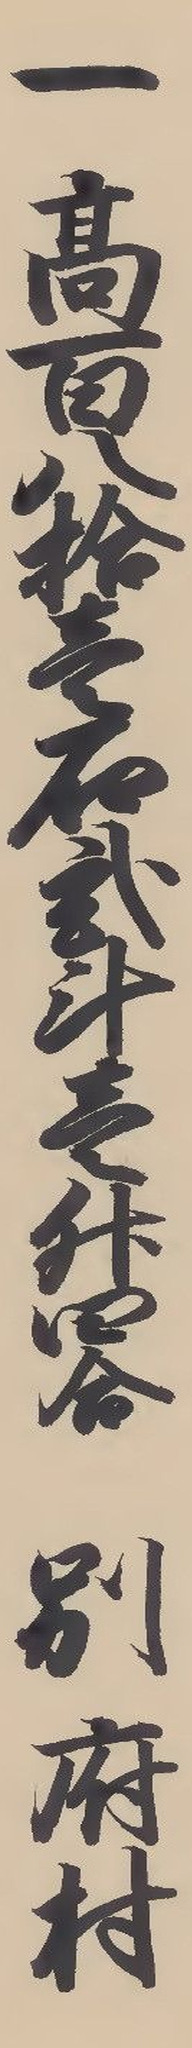一高百八拾壱石弐斗壱升四合別府村
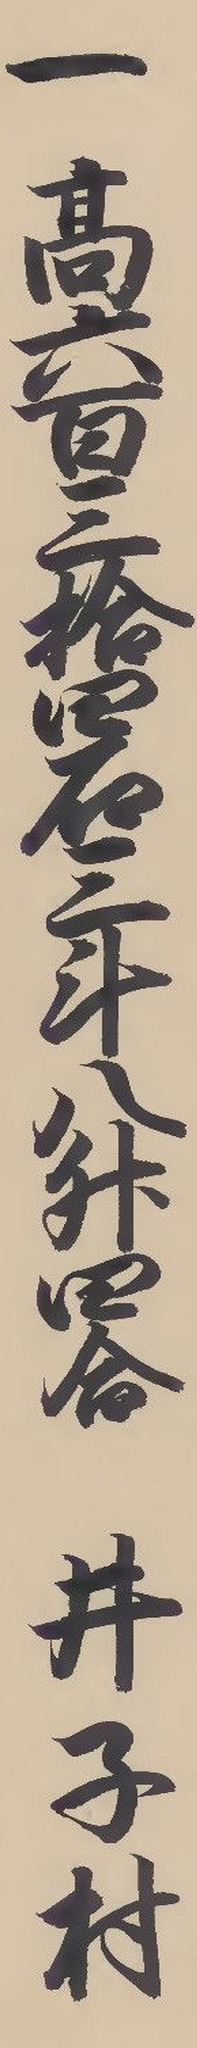一高六百三拾四石三斗八升四合井子村

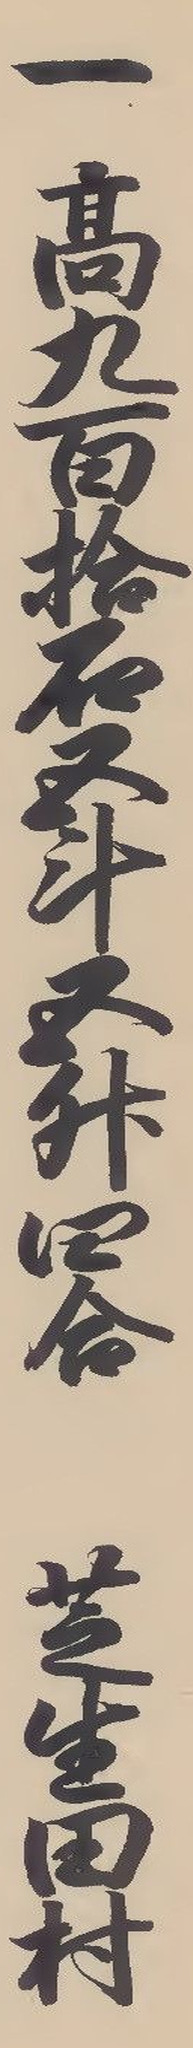一高九百拾石五斗五升四合芝生田村
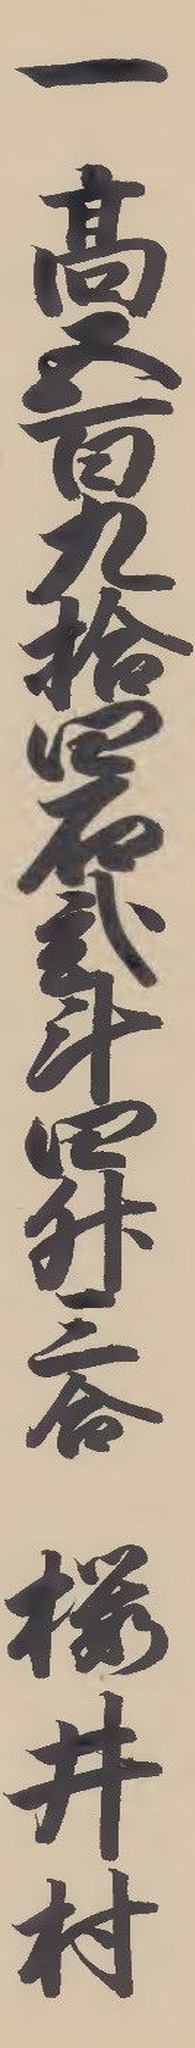一高五百九拾四石弐斗四升三合桜井村
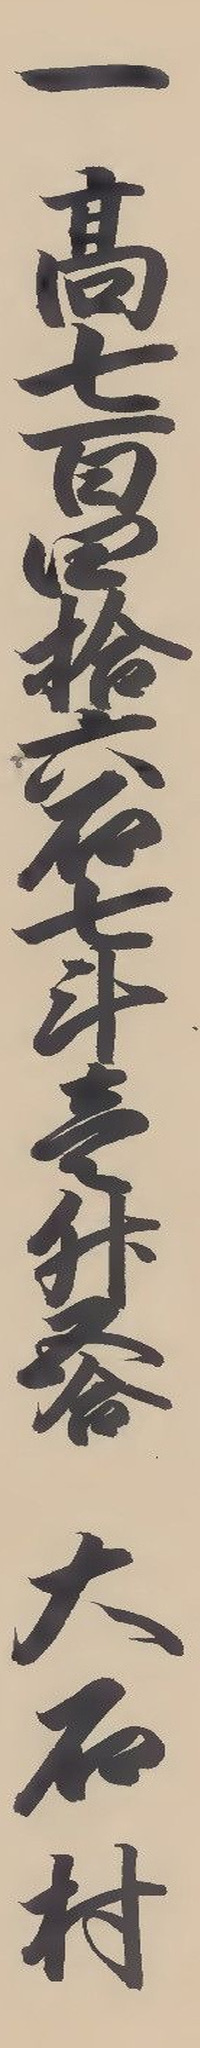一高七百四拾六石七斗壱升五合大石村
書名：信濃国郷帳
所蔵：国立公文書館 National Archives of Japan
